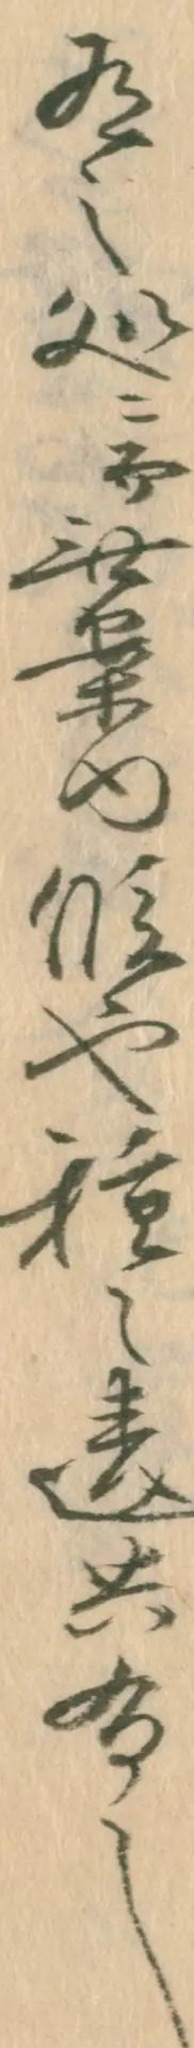有之処ニ而無案内候也種々違共有之
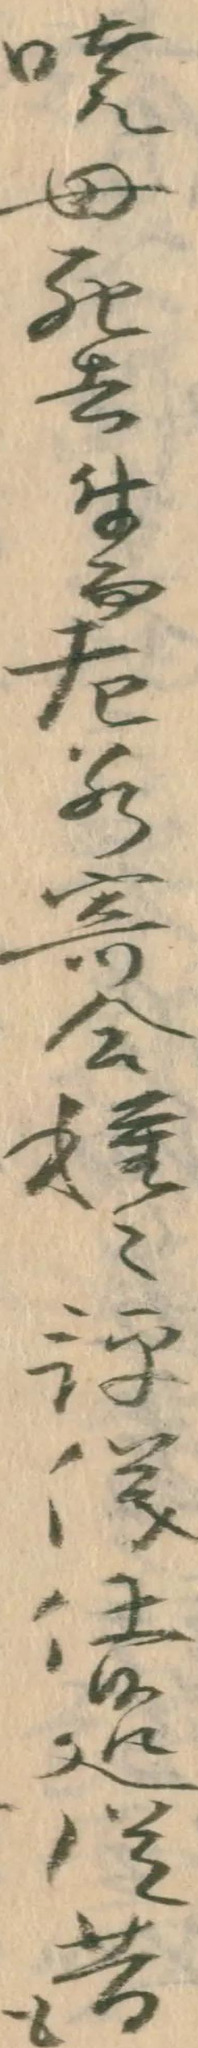暁母死去付而老若寄合種々評儀仕候処従昔も
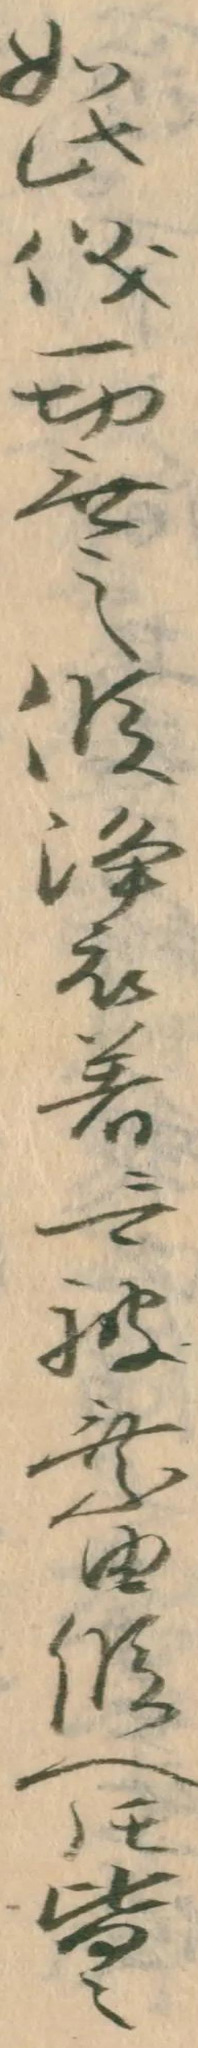如此儀一切無之候浄衣着ニ可被乗由候へトモ皆々
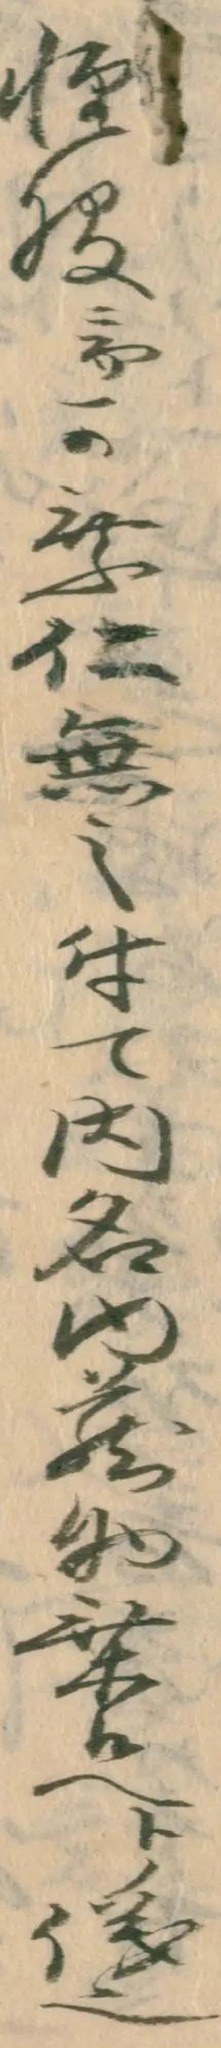軽服ニ而可乗仁無之付て内名内蔵助乗候へトノ儀也
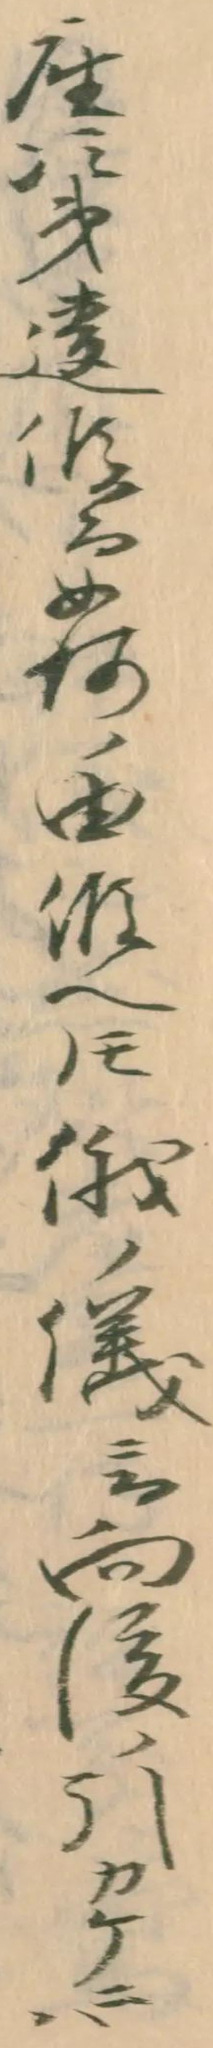座次第違候而如何ノ由候へトモ俄ノ儀ニ而向後ノ引カケニハ
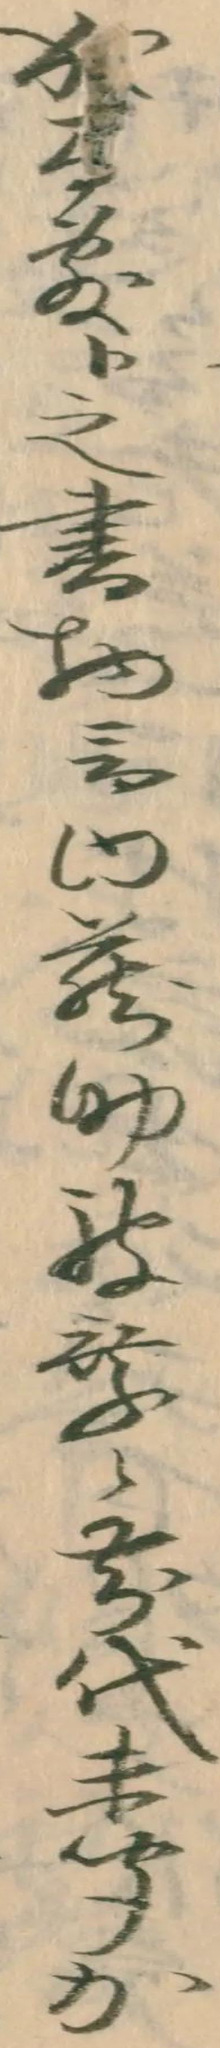成間敷ト之書物ニ而内蔵助被乗候前代未聞か
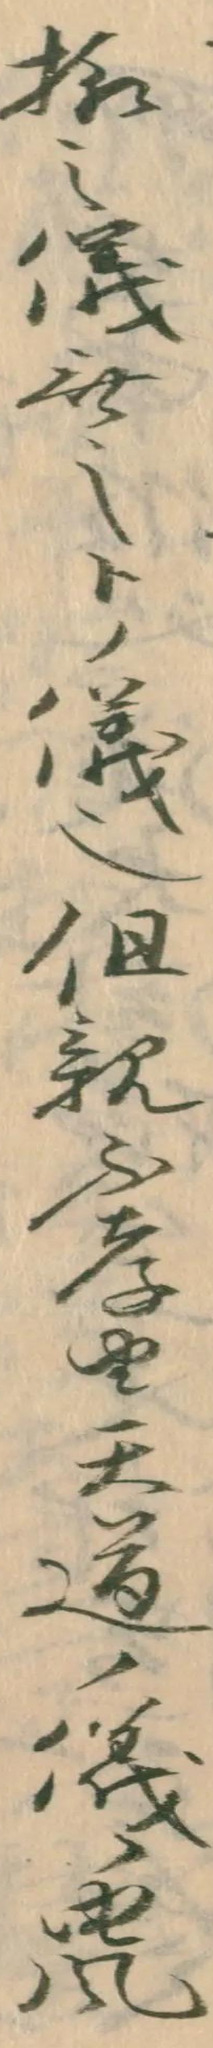様之儀無之トノ儀也但親不孝由天道ノ儀ノ由風
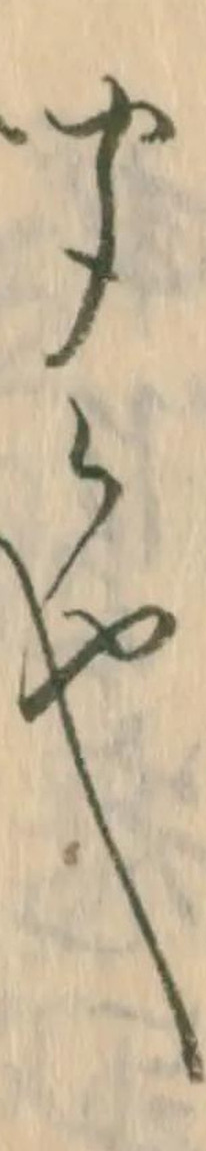聞候也
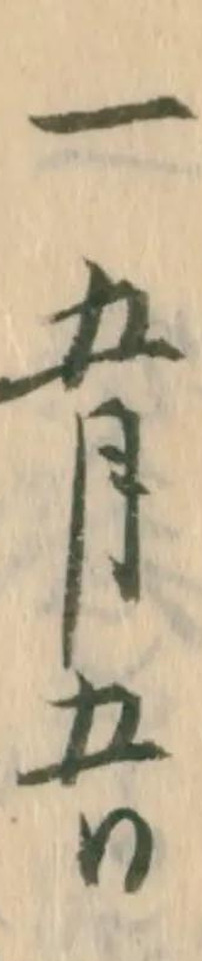一五月五日
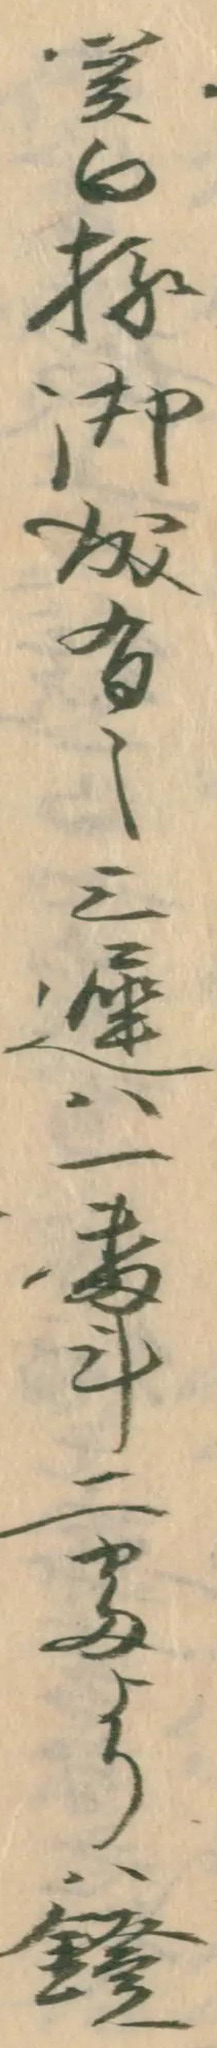関白様御成有之三遅は一番計二番よりハ鐙
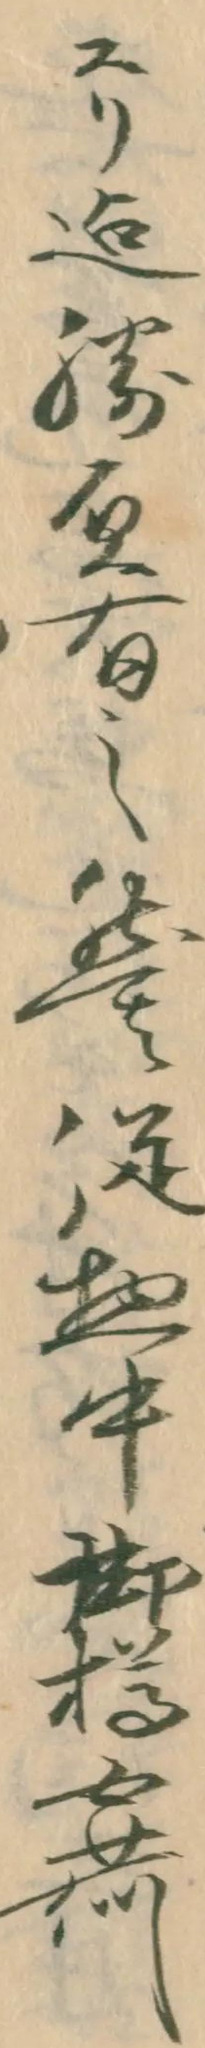スリ迄勝負有之然者従惣中御樽五荷
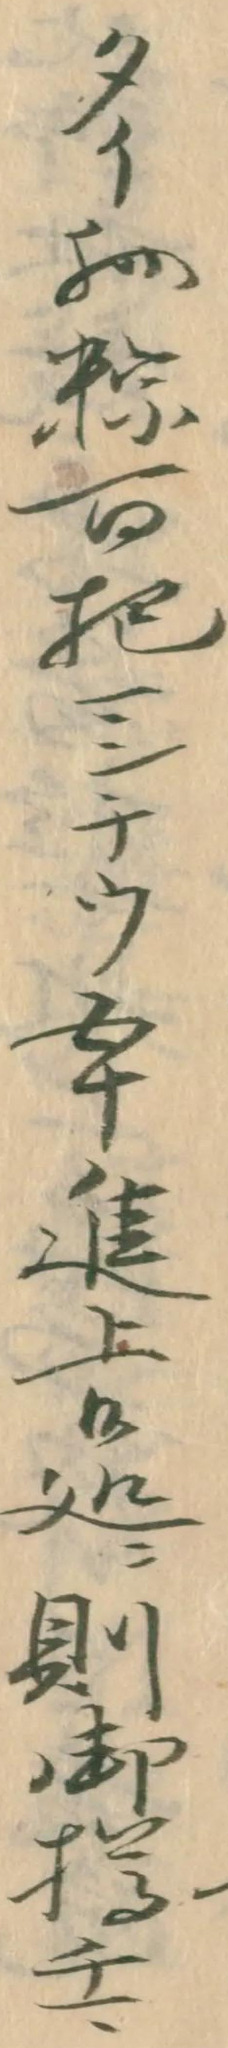タイ物粽百把マンチウ五十進上候処ニ則御樽チマ
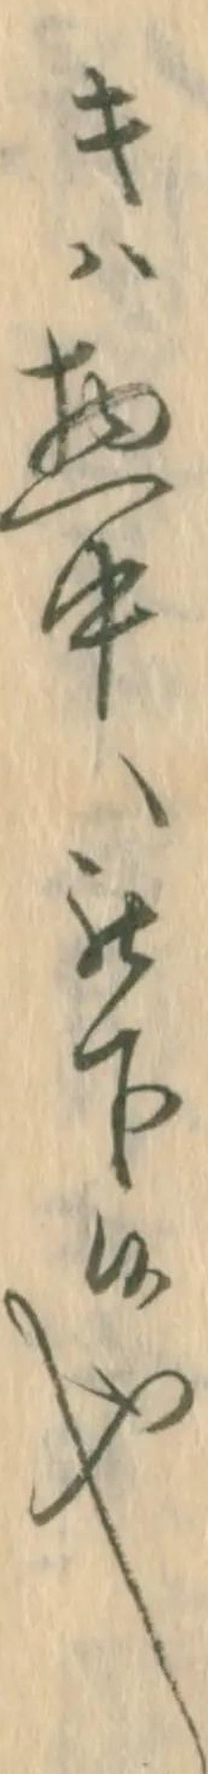キハ惣中へ被下候也
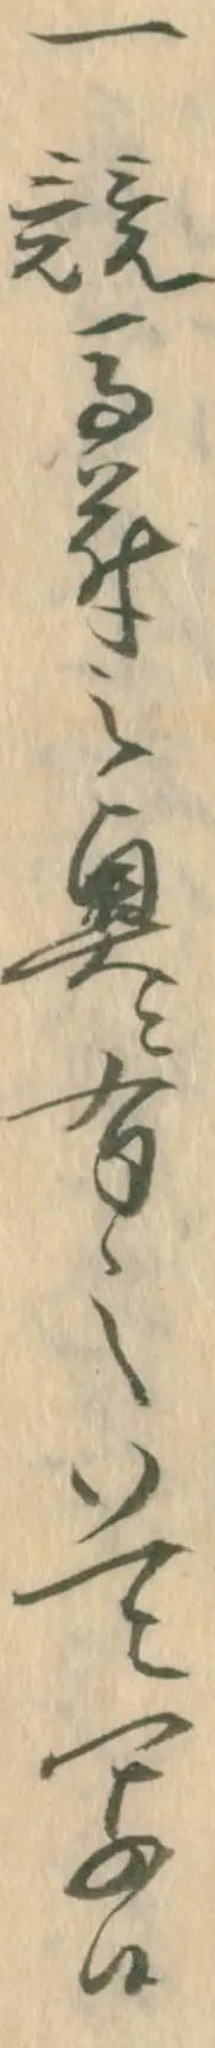一競馬符之奥に有之候て写候

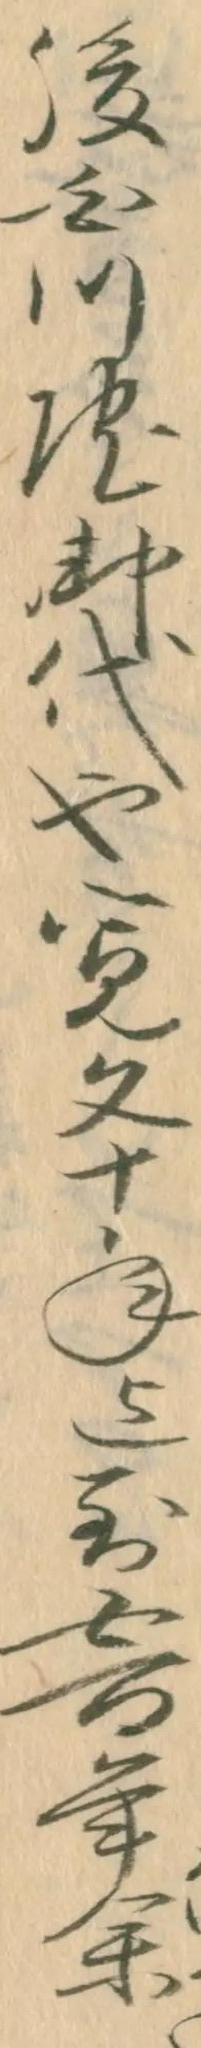後白川院御代也寛文十年迄至五百年余
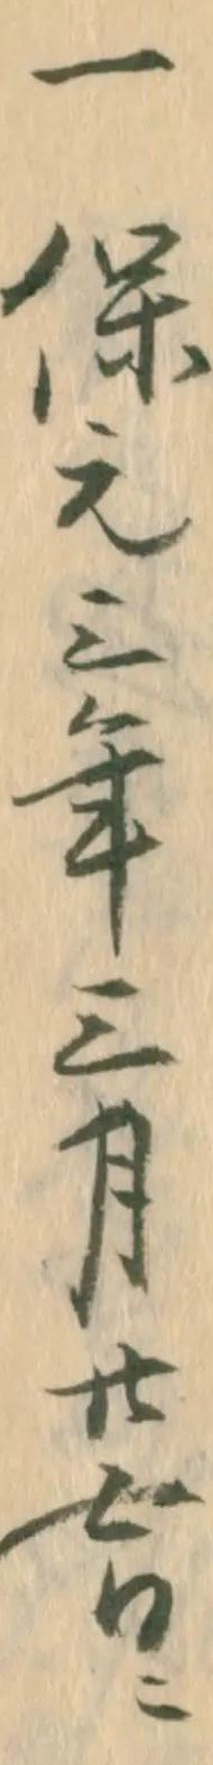一保元三年三月廿七日ニ
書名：賀茂社記録. 第12冊
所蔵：国立国会図書館 National Diet Library, JAPAN
